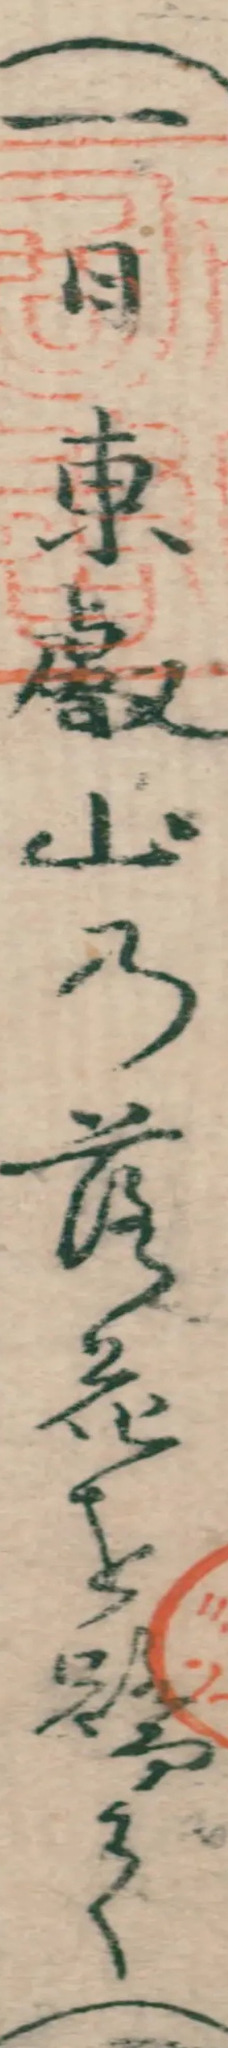一日東叡山の落花を踏て
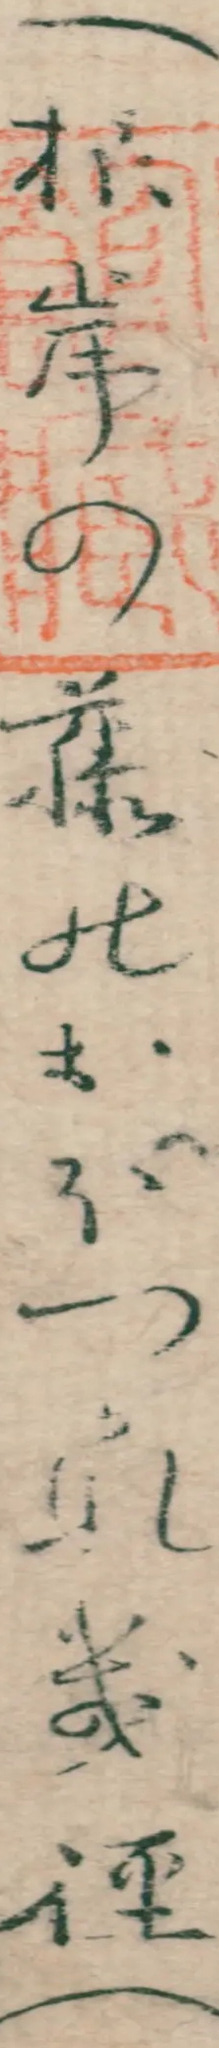根岸の藤のおほつかなき徑
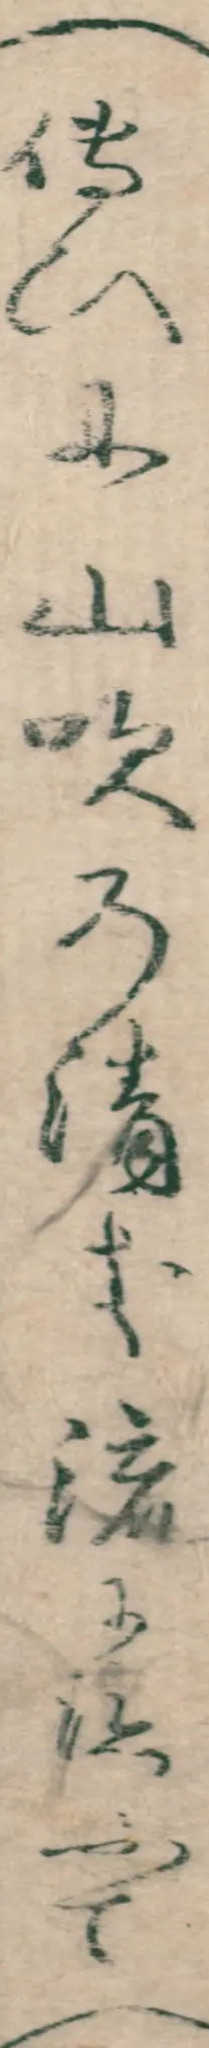伝ひに山吹の清き流にそふて
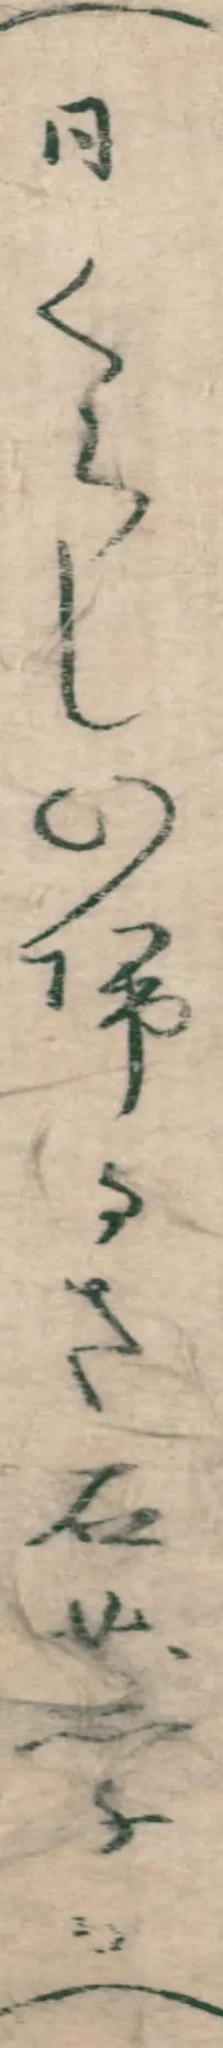日くらしの帰るさ石燕子か
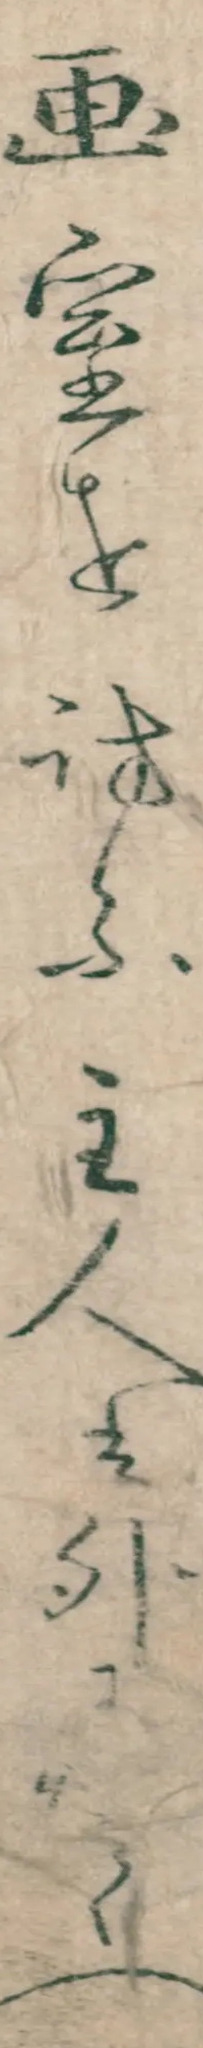画室を訪ふ主人は外にて
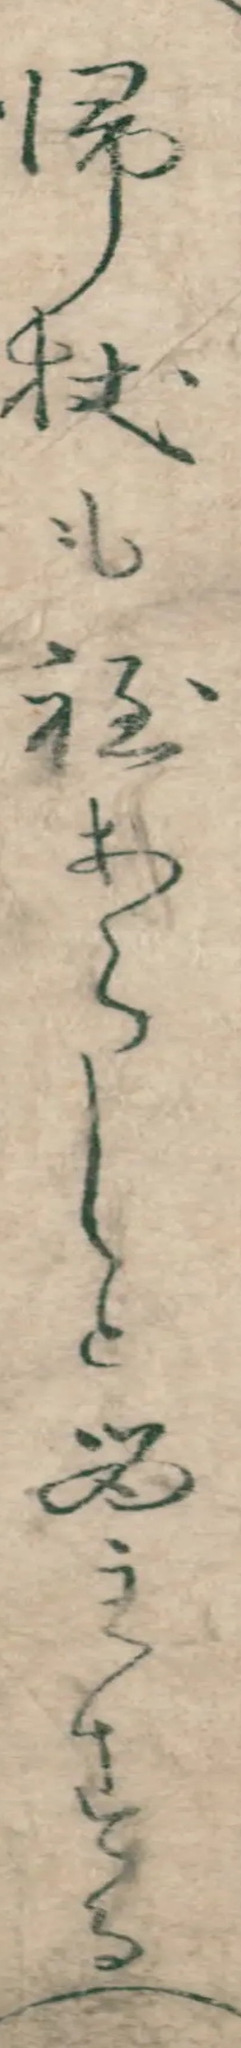帰杖も程あらしと留主する
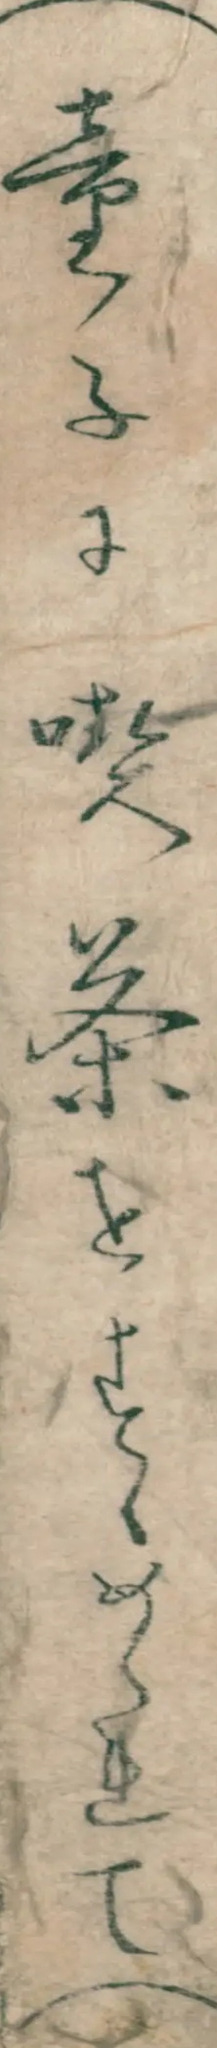童子に喫茶をすゝめられて

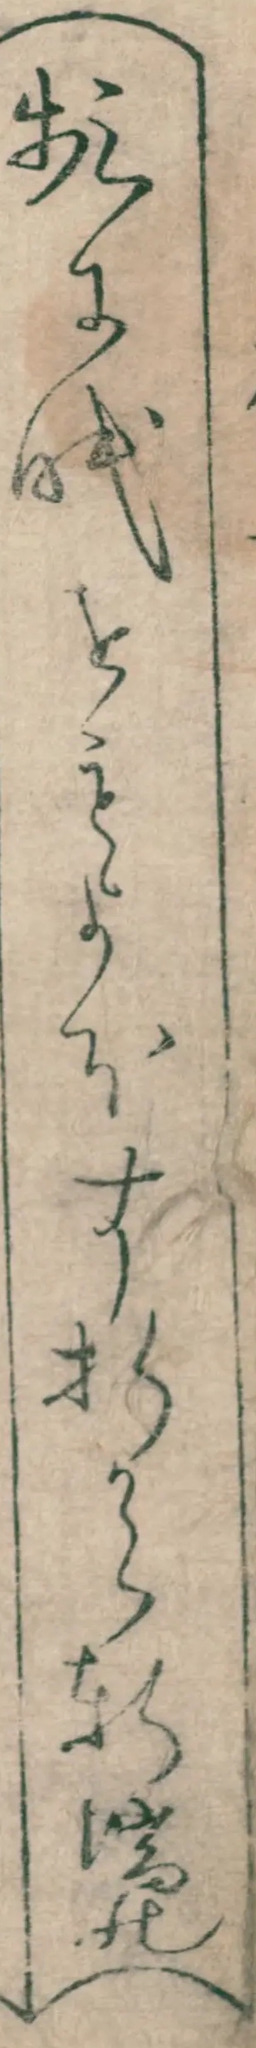頻に眠をもよほす折から軒端の
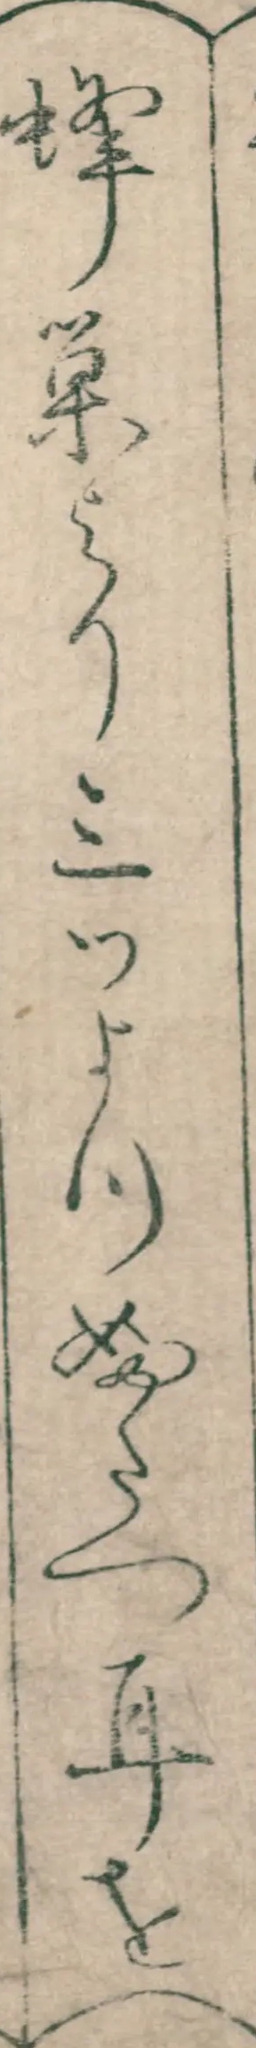蜂巣より三つよつふたつ耳を
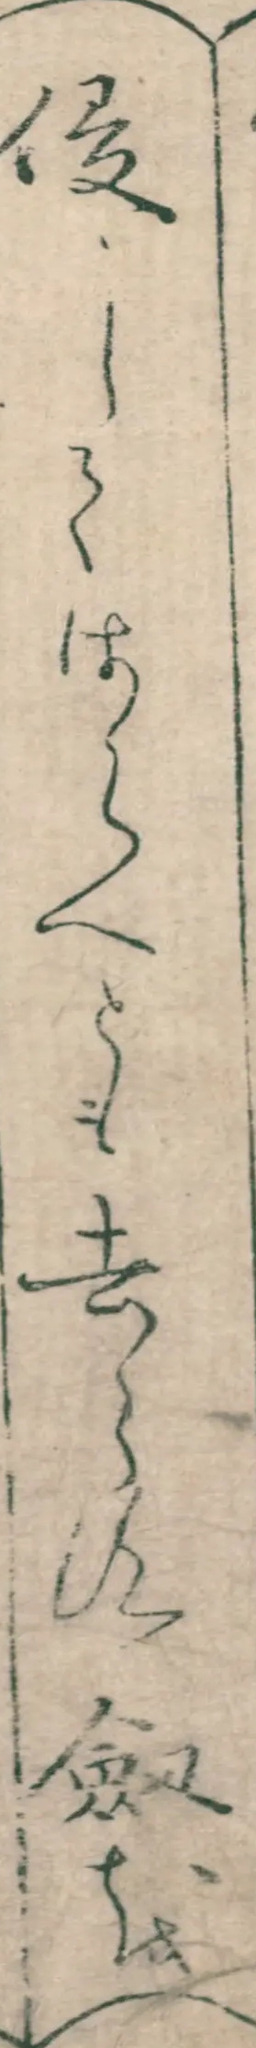侵してはらへとも去らす剣を
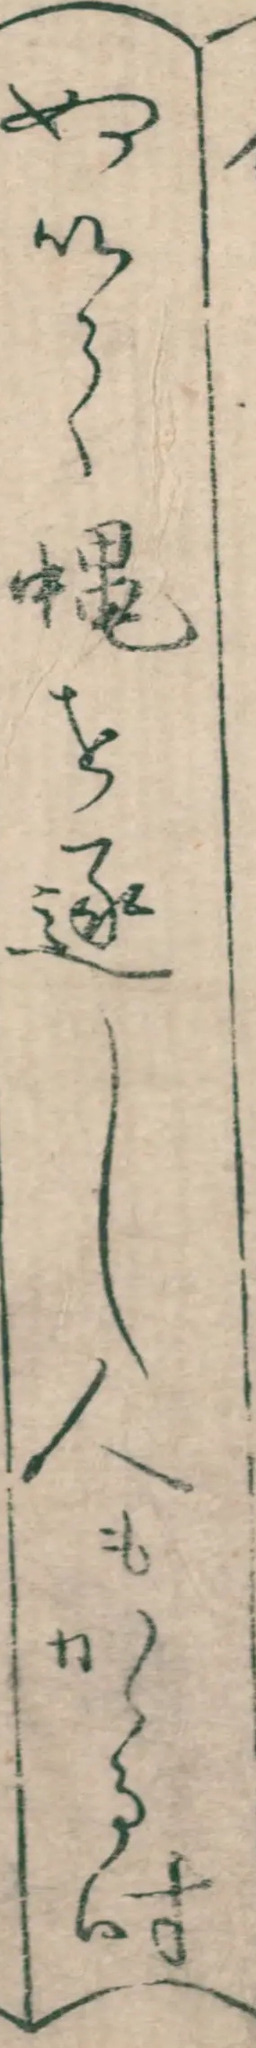ぬいて蠅を逐し人もかゝる時
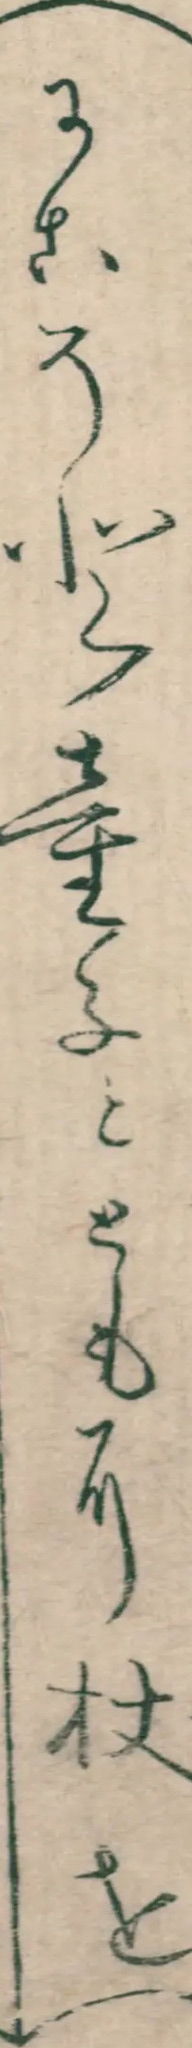にこそと童子とともに杖を
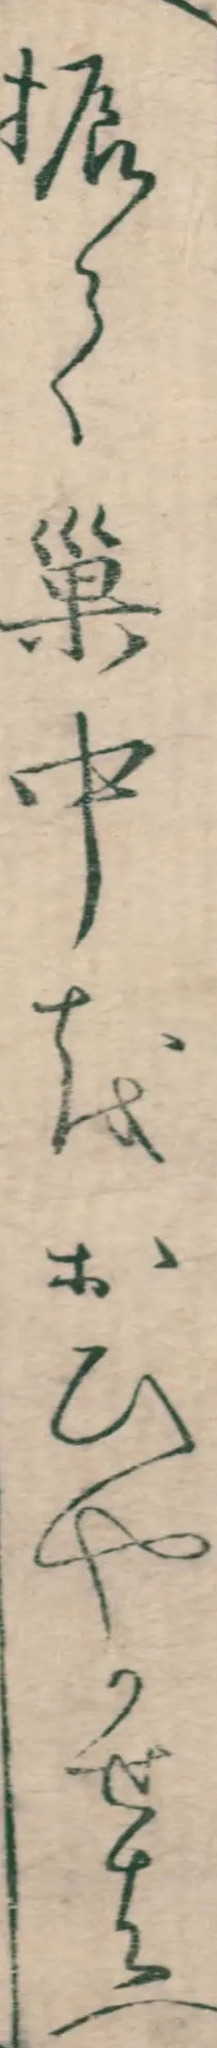振て巣中をおひやかせは
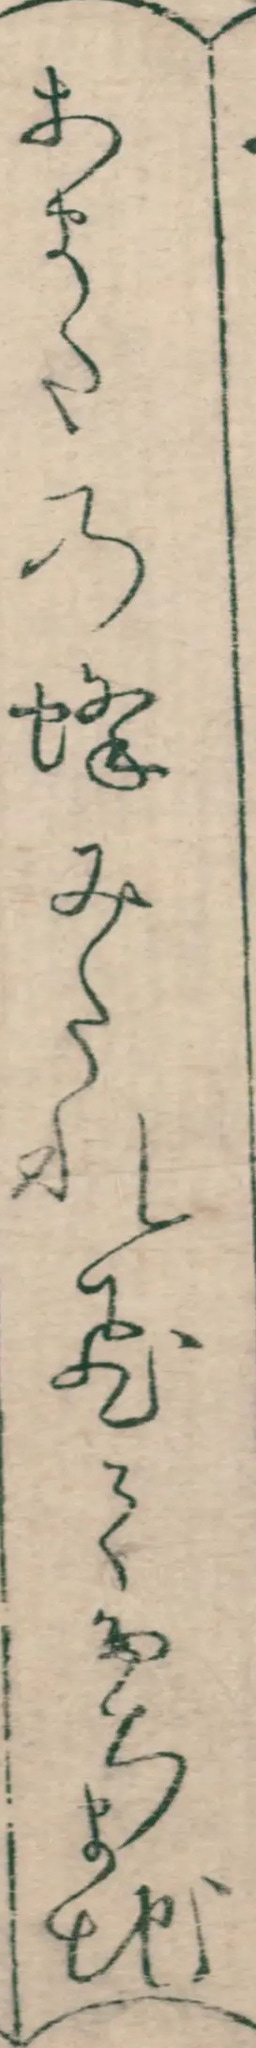あまたの蜂みたれ飛てたちまち
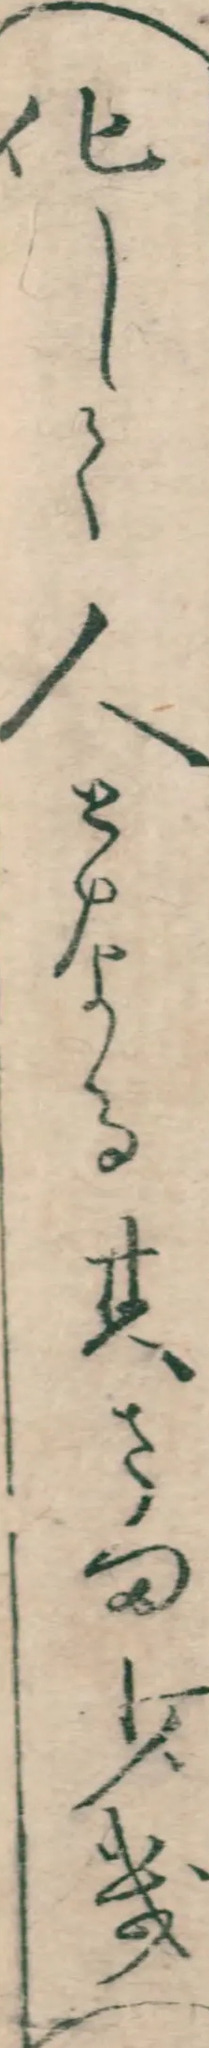化して人となる其さま少き
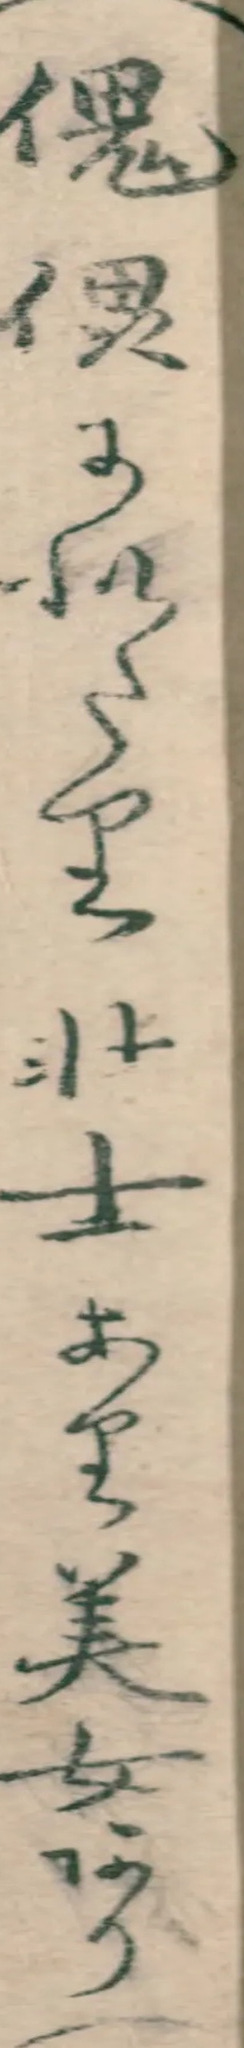傀儡に似たり壮士あり美女あり
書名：百鬼夜行 3巻拾遺3巻. [1]
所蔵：国立国会図書館 National Diet Library, JAPAN
